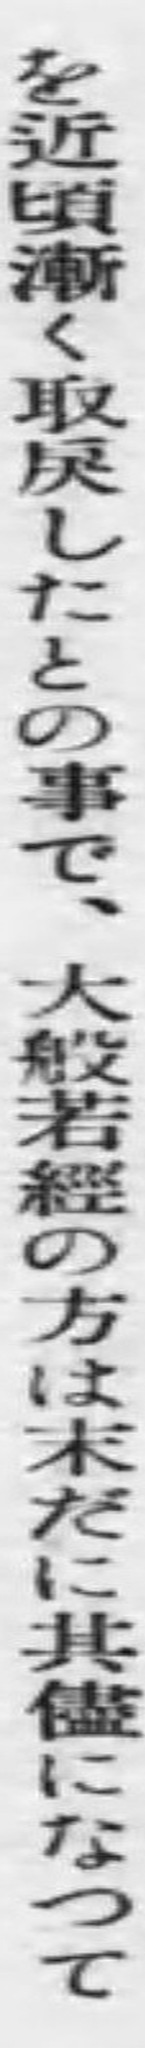を近頃漸く取戻したとの事で、大般若経の方は末だに其侭になつて
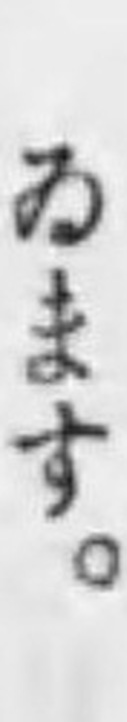ゐます。
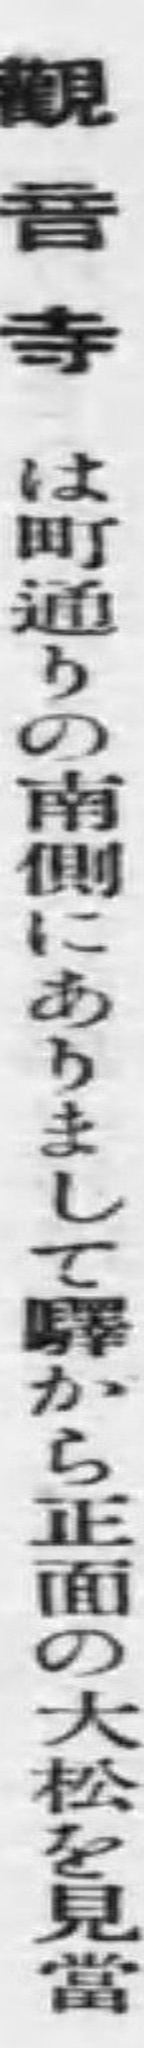観音寺は町通りの南側にありまして駅から正面の大松を見当
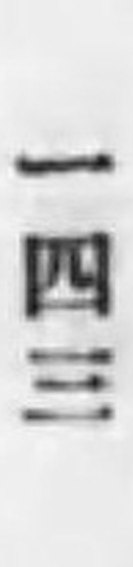一四三

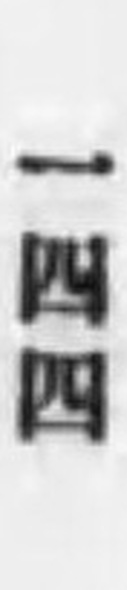一四四
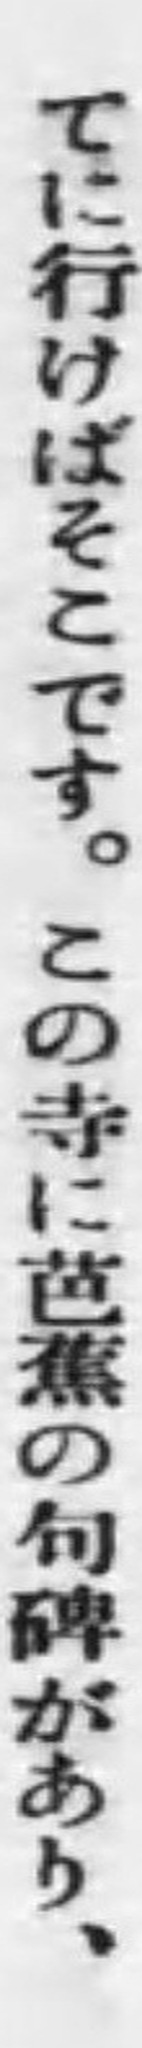てに行けばそこです。この寺に芭蕉の句碑があり、
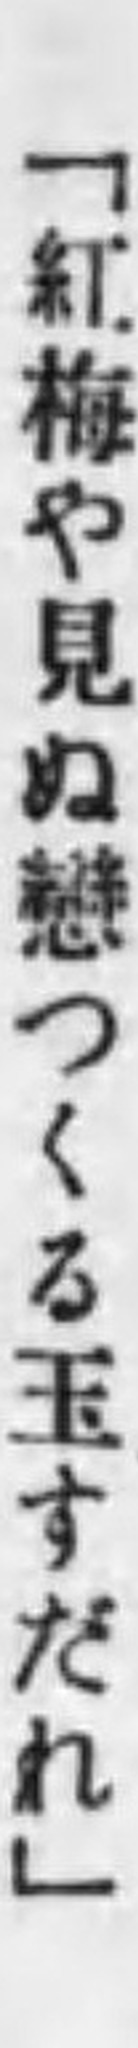「紅梅や見ぬ恋つくる玉すだれ」
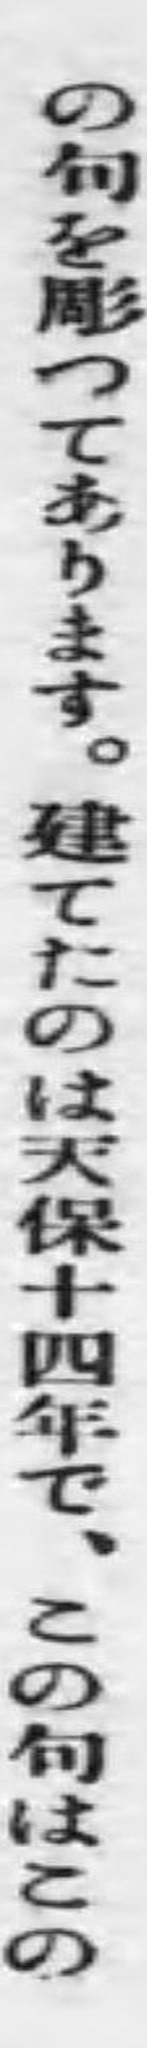の句を彫つてあります。建てたのは天保十四年で、この句はこの
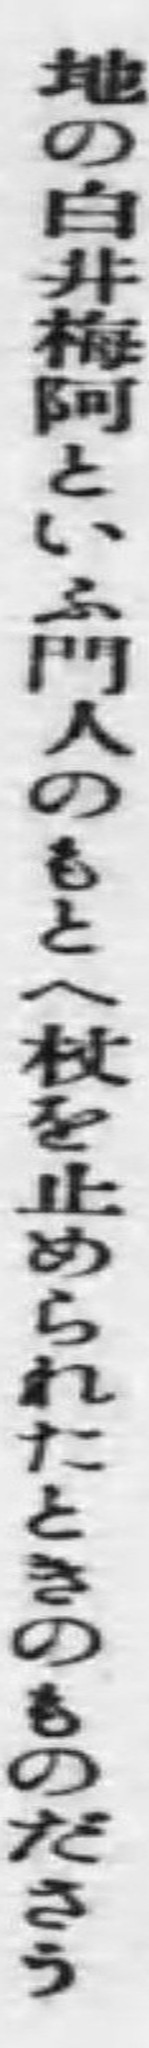地の白井梅阿といふ門人のもとへ杖を止められたときのものださう
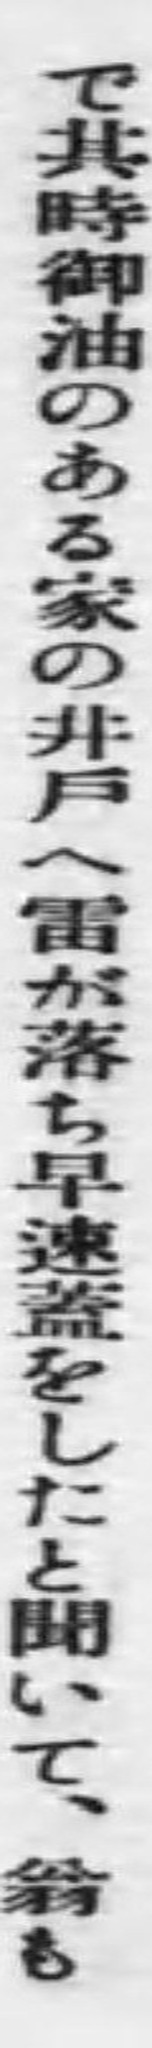で其時御油のある家の井戸へ雷が落ち早速蓋をしたと聞いて、翁も
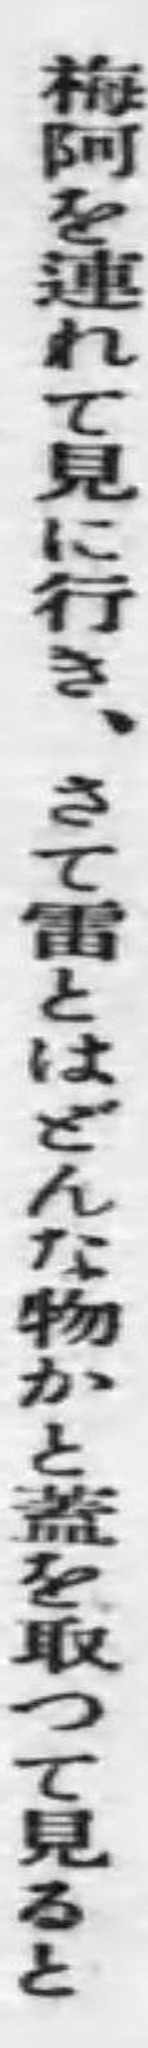梅阿を連れて見に行き、さて雷とはどんな物かと蓋を取つて見ると
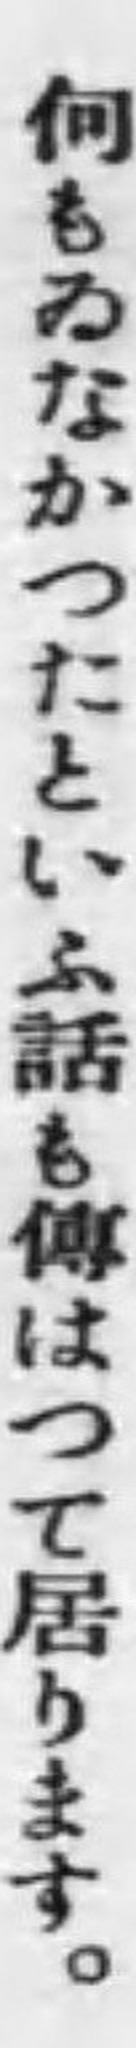何もゐなかつたといふ話も伝はつて居ります。
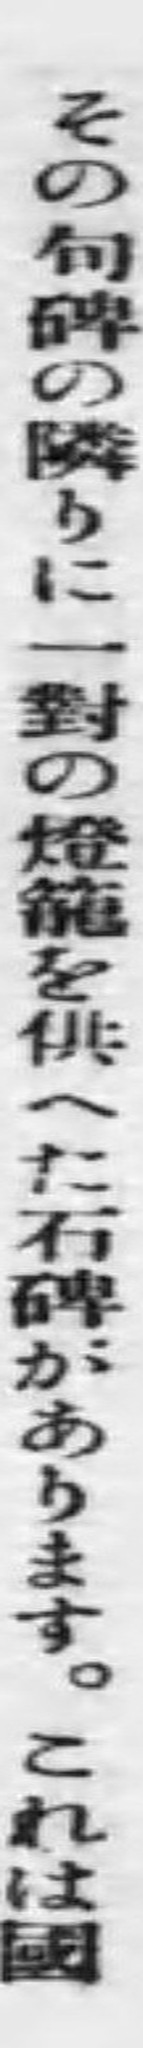その句碑の隣りに一対の灯籠を供へた石碑があります。これは国
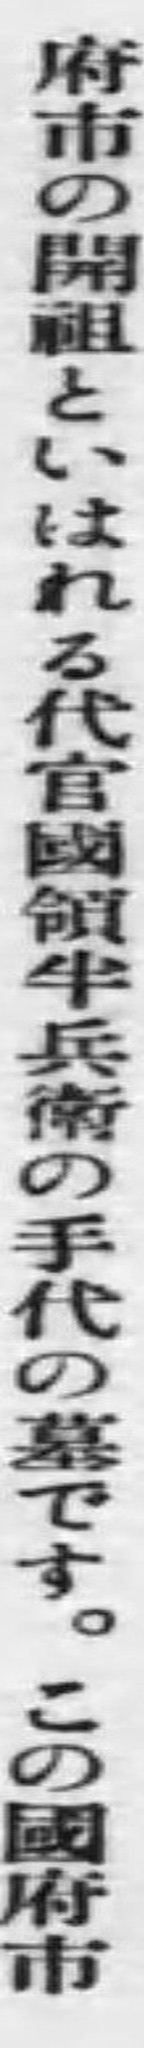府市の開祖といはれる代官国領半兵衛の手代の墓です。この国府市
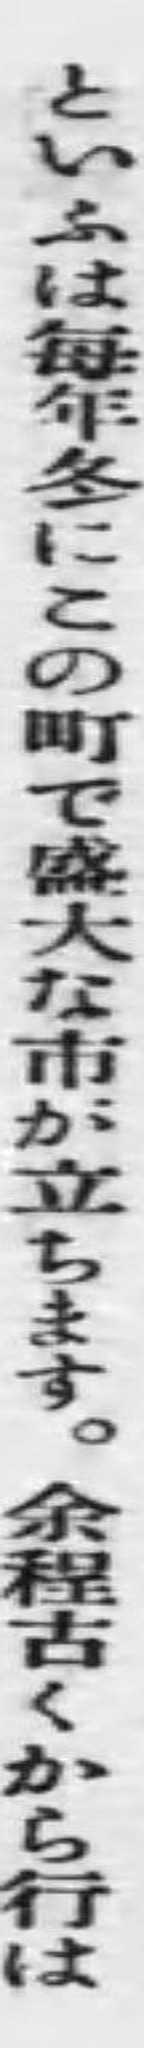といふは毎年冬にこの町で盛大な市が立ちます。余程古くから行は
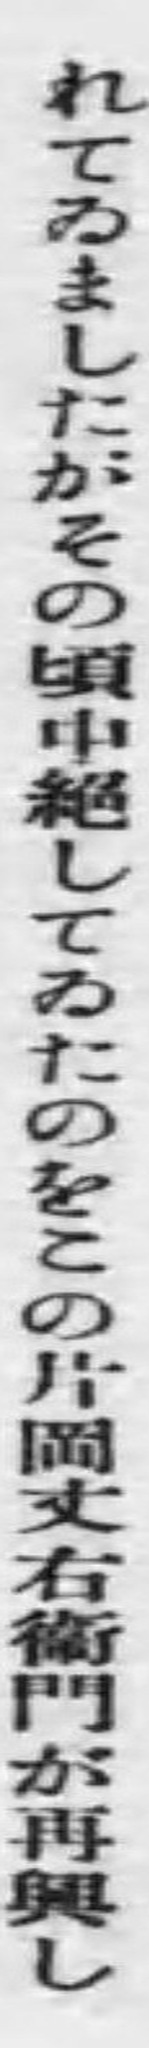れてゐましたがその頃中絶してゐたのをこの片岡丈右衛門が再興し
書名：東三河道中記 : 豊橋市及其附近案内
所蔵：国立国会図書館 National Diet Library, JAPAN
